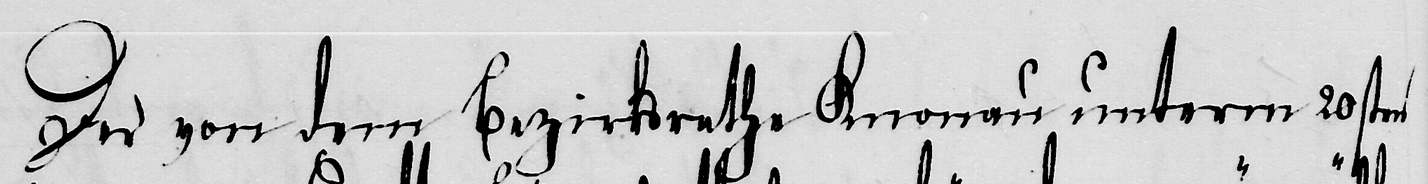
Der von dem Bezirksrathe Knonau unterm 20sten
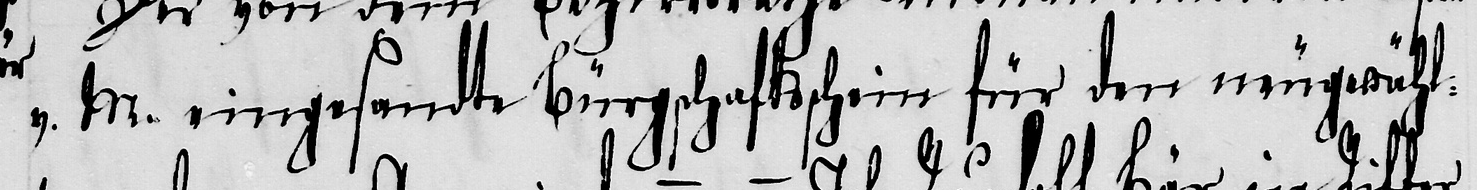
v. M. eingesandte Bürgschaftsschein für den neugewähl¬
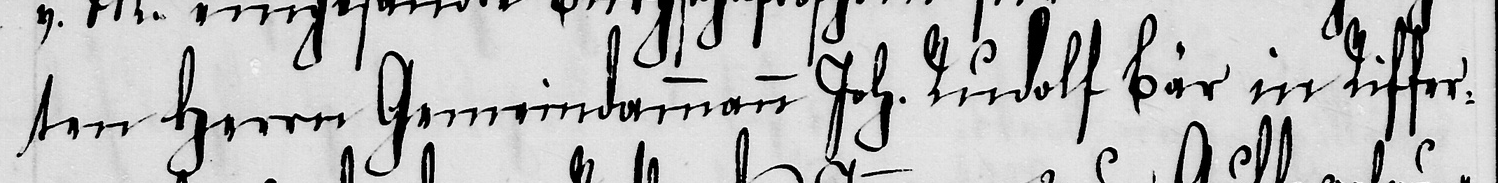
ten Herrn Gemeindammann Joh. Rudolf Bär in Riffer¬
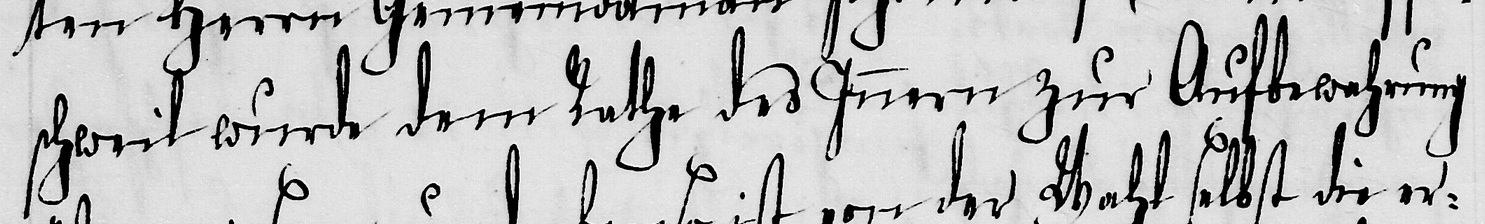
schweil wurde dem Rathe des Innern zur Aufbewahrung
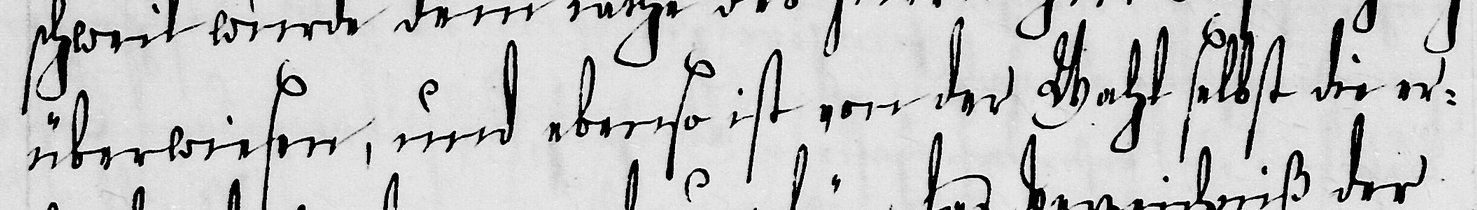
überwiesen, und ebenso ist von der Wahl selbst die e¬
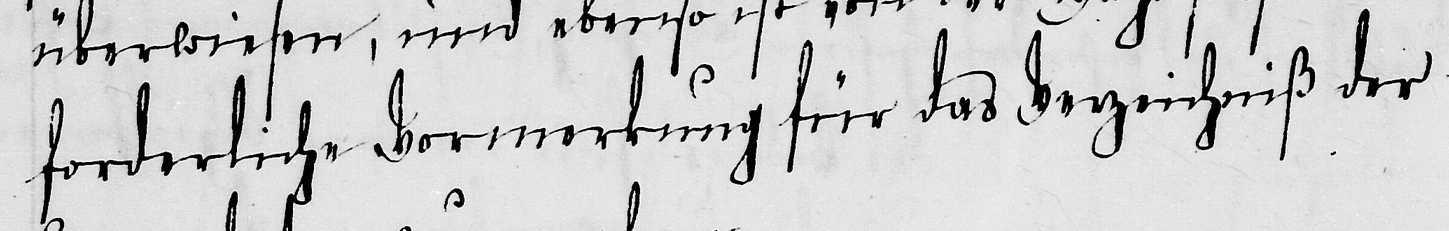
rforderliche Vormerkung für das Verzeichniß der
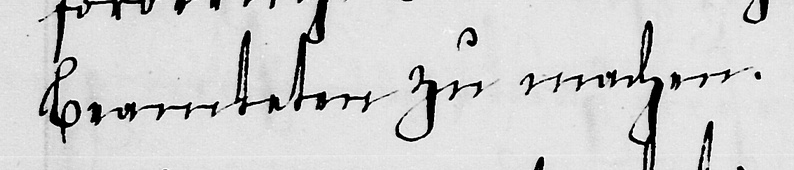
Beamteten zu machen.
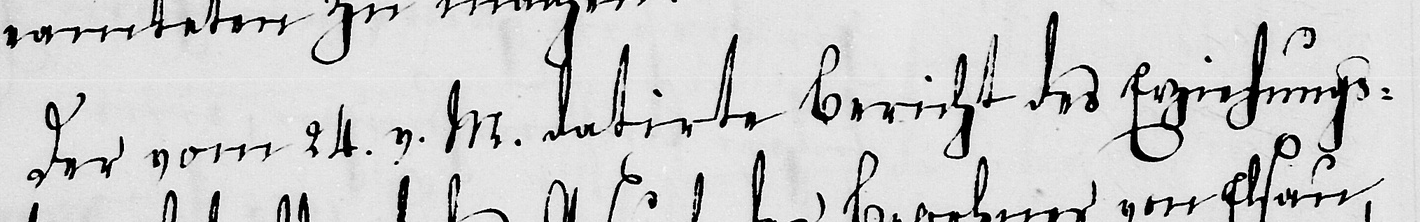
Der vom 24. v. M. datirte Bericht des Erziehungs¬
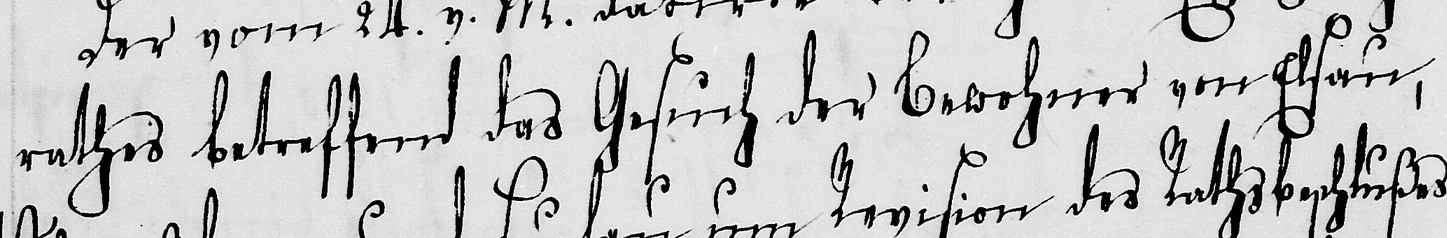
rathes betreffend das Gesuch der Bewohner von Elsau,
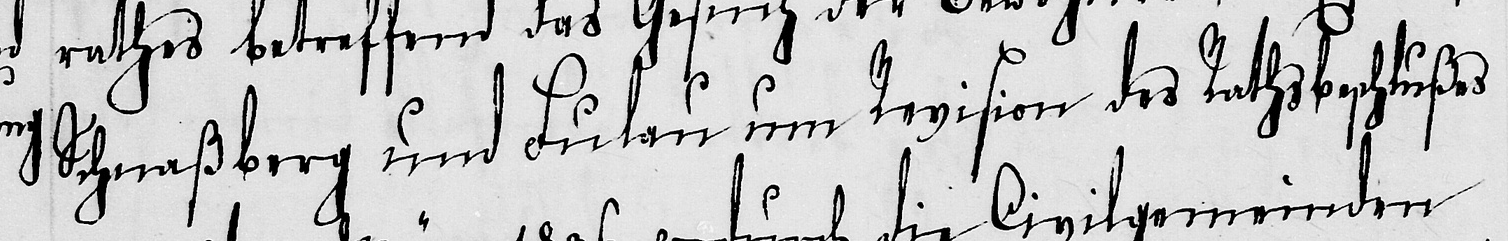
Schnaßberg und Fulau um Revision des Rathsbeschluß¬
